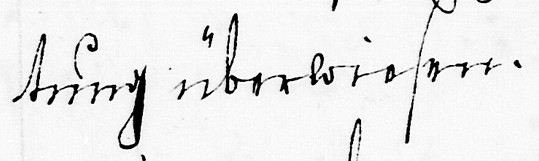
tung überwiesen.
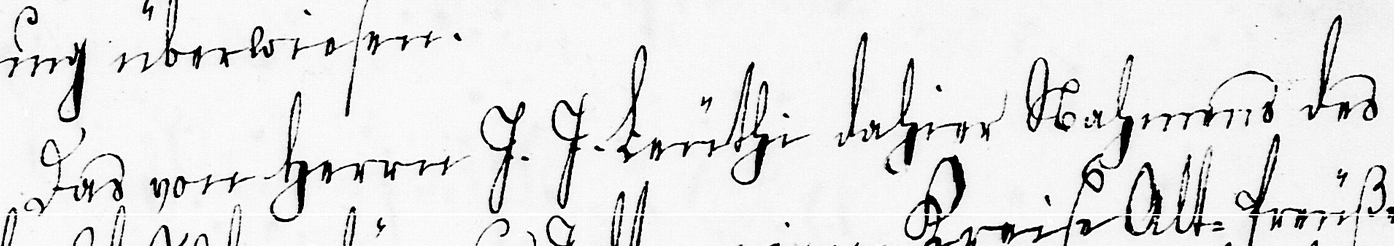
Das von Herrn J. J. Leuthi dahier Nahmens des
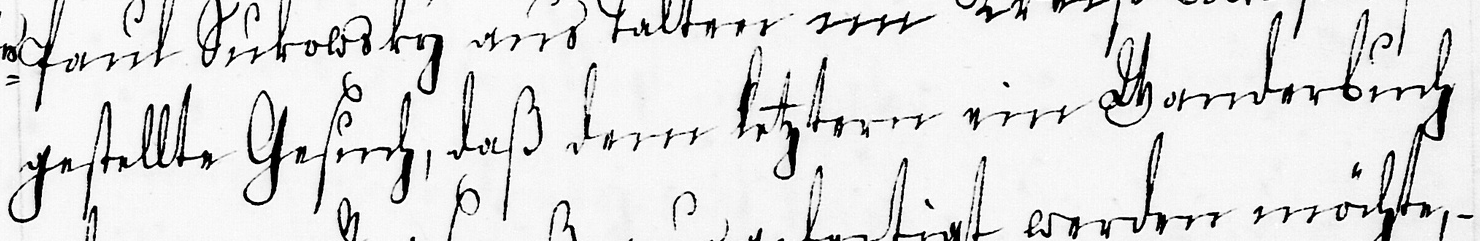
gestellte Gesuch, daß dem letztern ein Wanderbuch
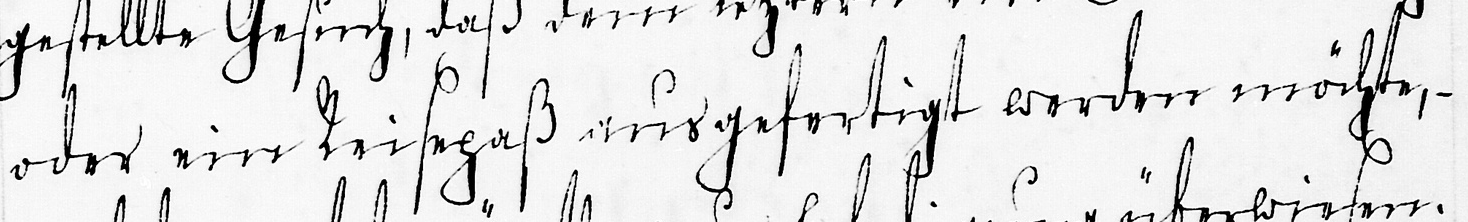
oder ein Reisepaß ausgefertigt werden möchte, –
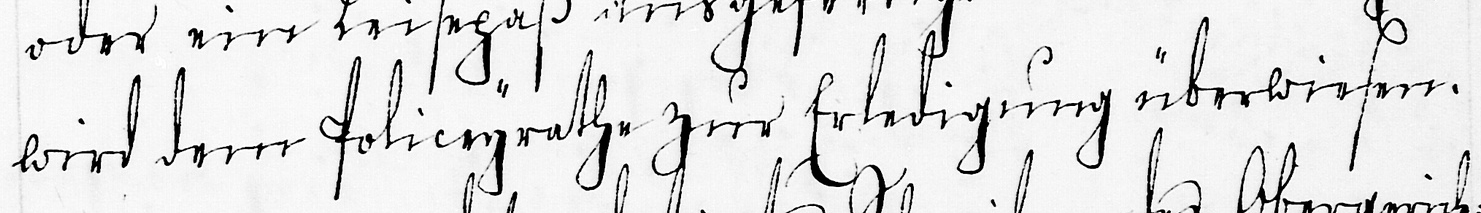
wird dem Policeyrathe zur Erledigung überwiesen.
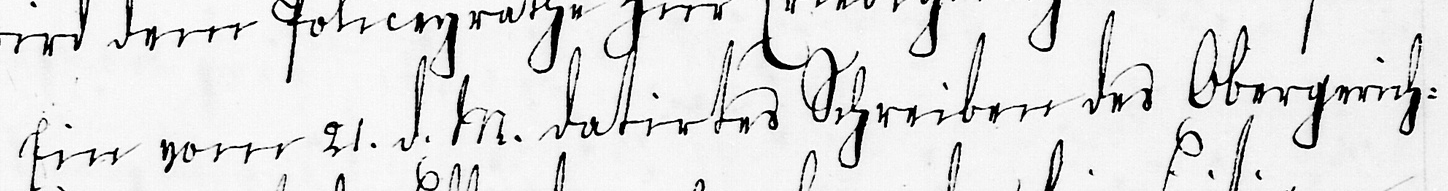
Ein vom 21. d. M. datirtes Schreiben des Obergerich¬
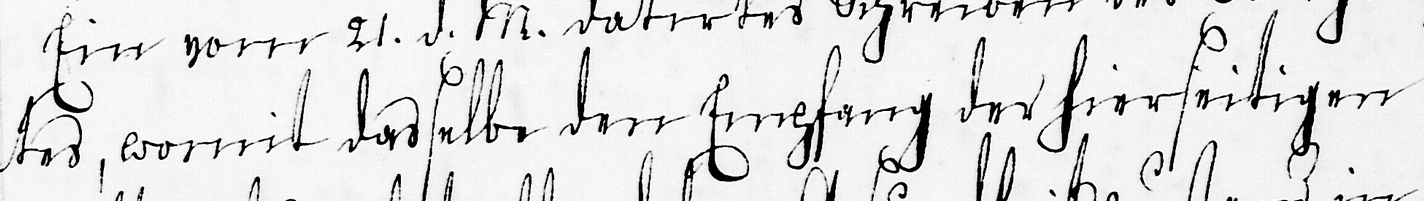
tes, womit dasselbe den Empfang der hierseitigen
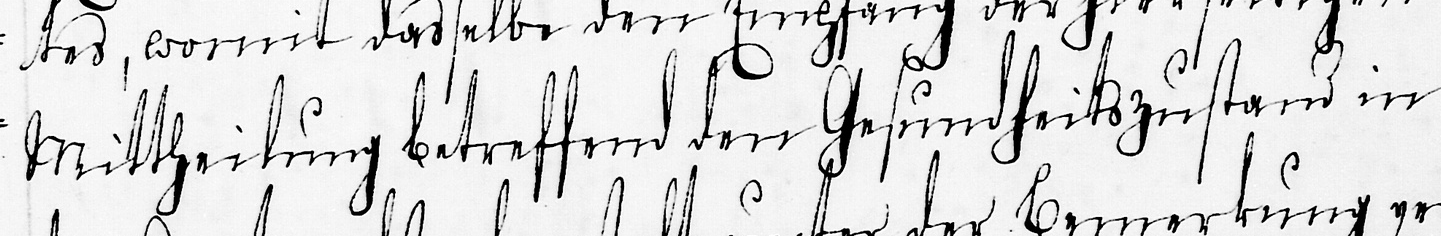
Mittheilung betreffend den Gesundheitszustand in
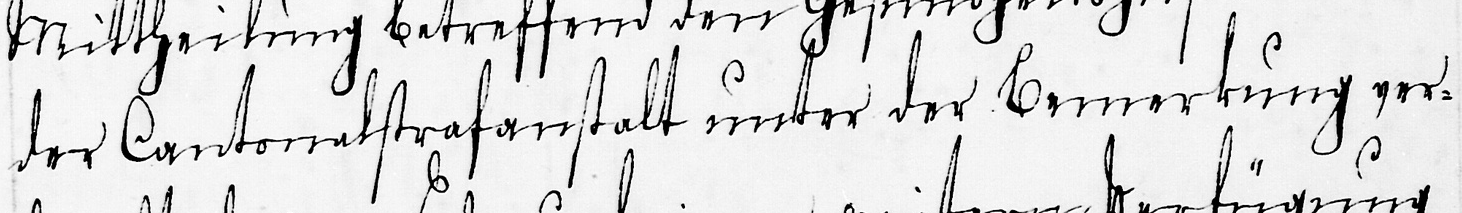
der Cantonalstrafanstalt unter der Bemerkung ver¬
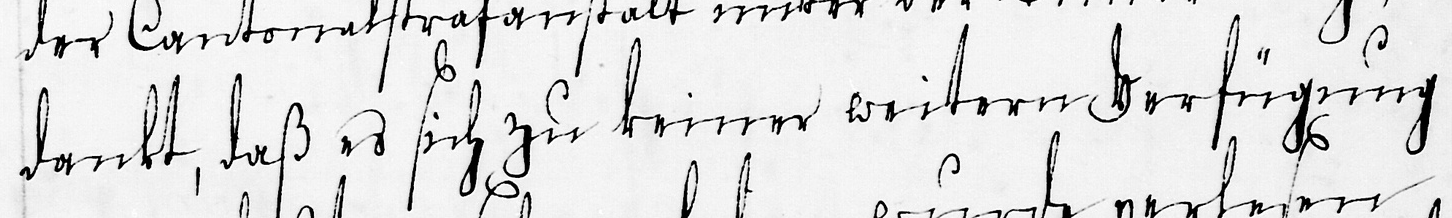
dankt, daß es sich zu keiner weitern Verfügung
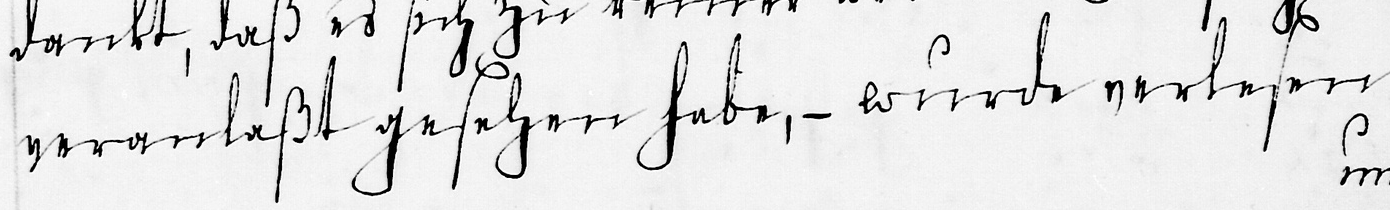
veranlaßt gesehen habe, – wurde verlesen
